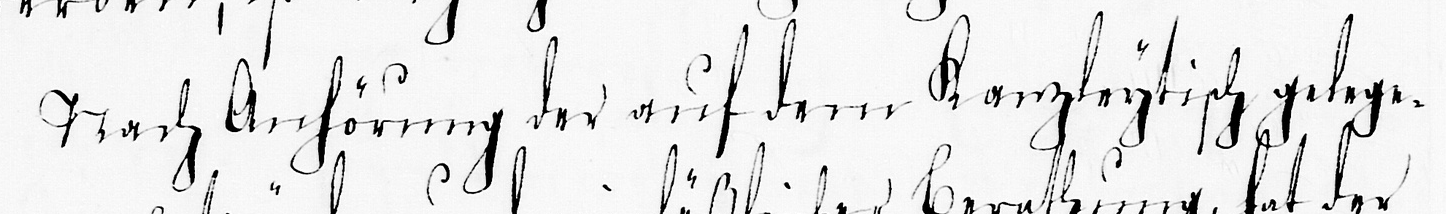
Nach Anhörung der auf dem Kanzleytisch geleg¬
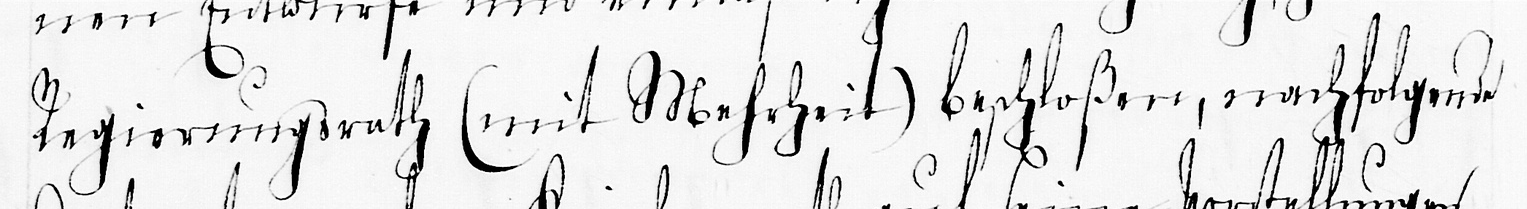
Regierungsrath (mit Mehrheit) beschloßen, nachfolgende
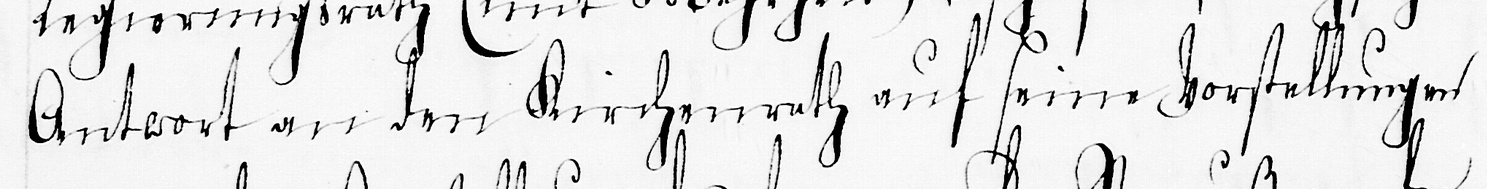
Antwort an den Kirchenrath auf seine Vorstellungen
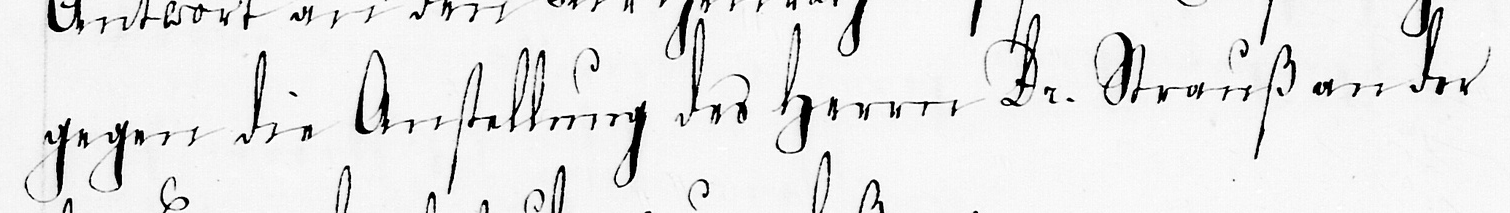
gegen die Anstellung des Herrn Dr. Strauß an der
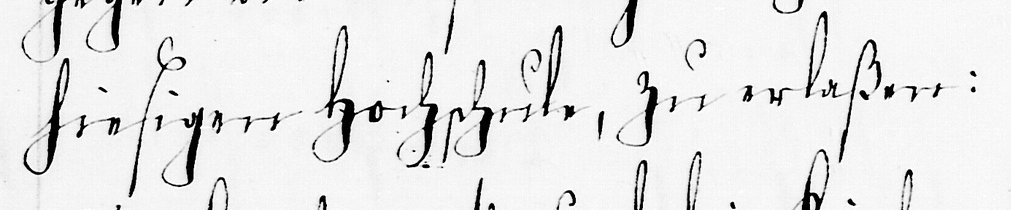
hiesigen Hochschule, zu erlaßen:
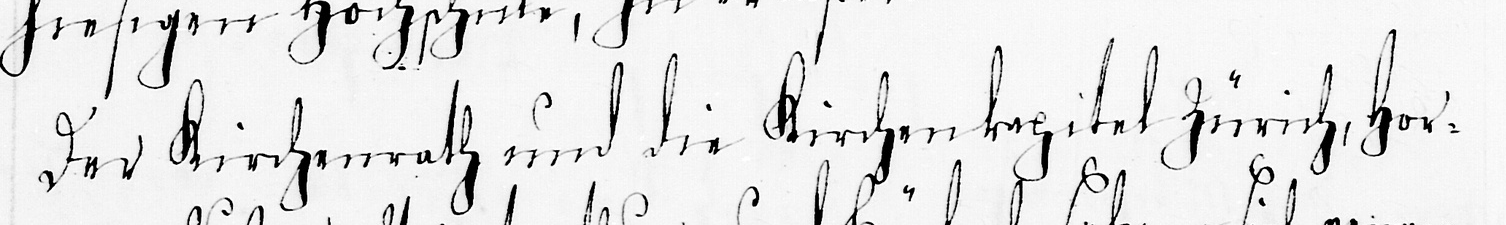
Der Kirchenrath und die Kirchenkapitel Zürich, Hor¬
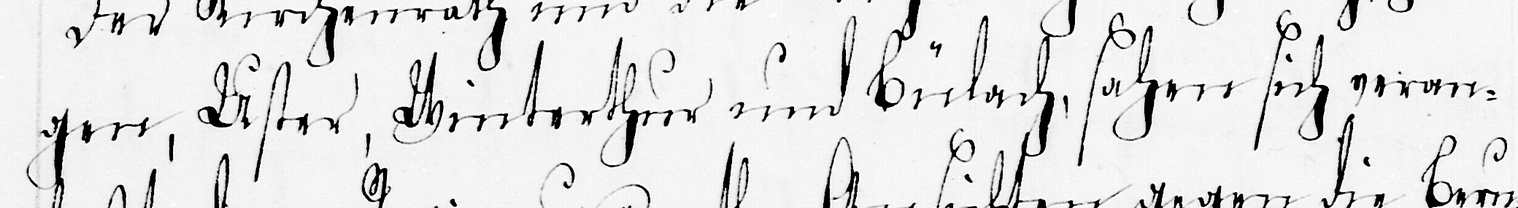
gen, Uster, Winterthur und Bülach, sahen sich veran¬
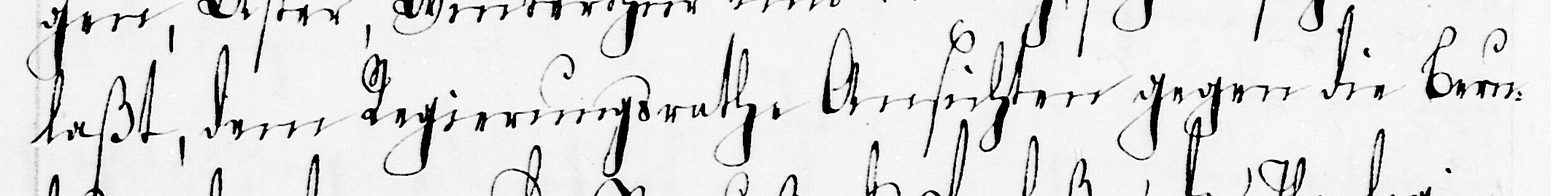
laßt, dem Regierungsrathe Ansichten gegen die Beru¬
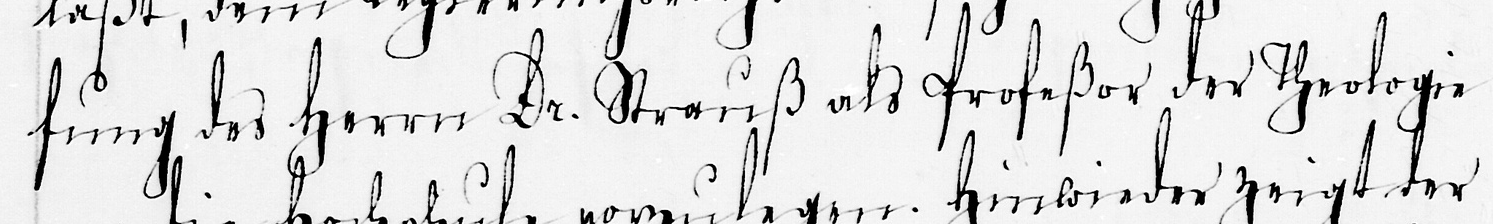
fung des Herrn Dr. Strauß als Profeßor der Theologie
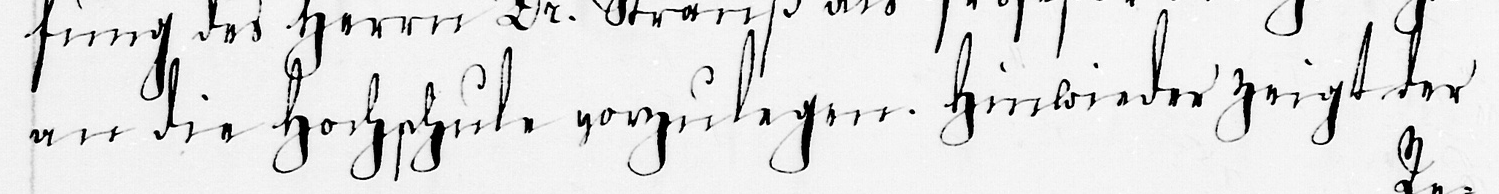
an die Hochschule vorzulegen. Hinwieder zeigt der
